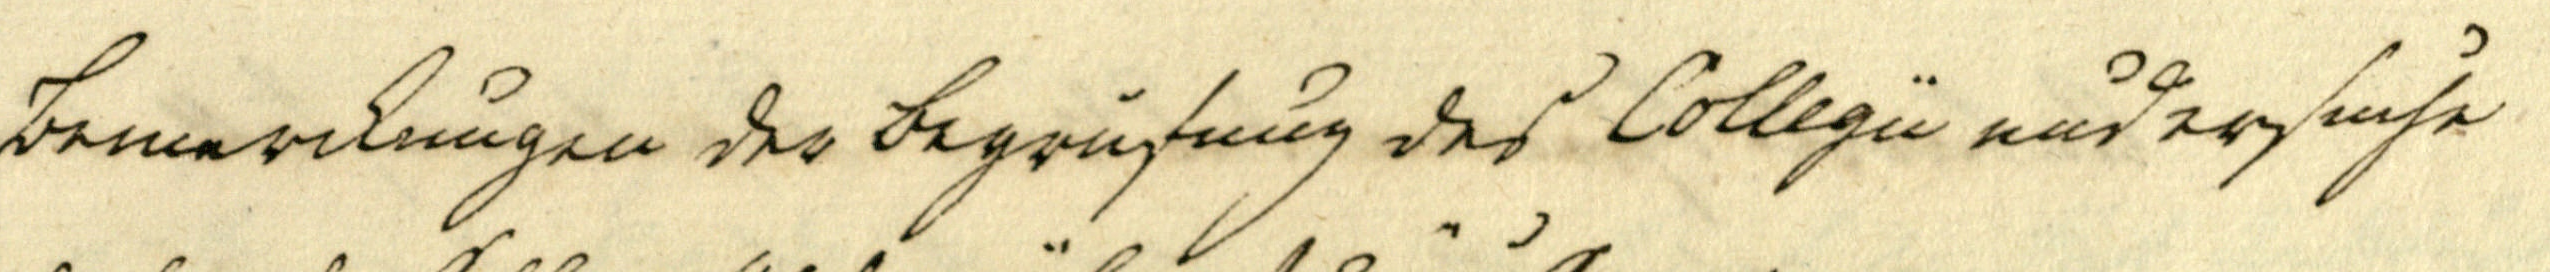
Bemerckungen der Beprüfung des Collegii und ersuche
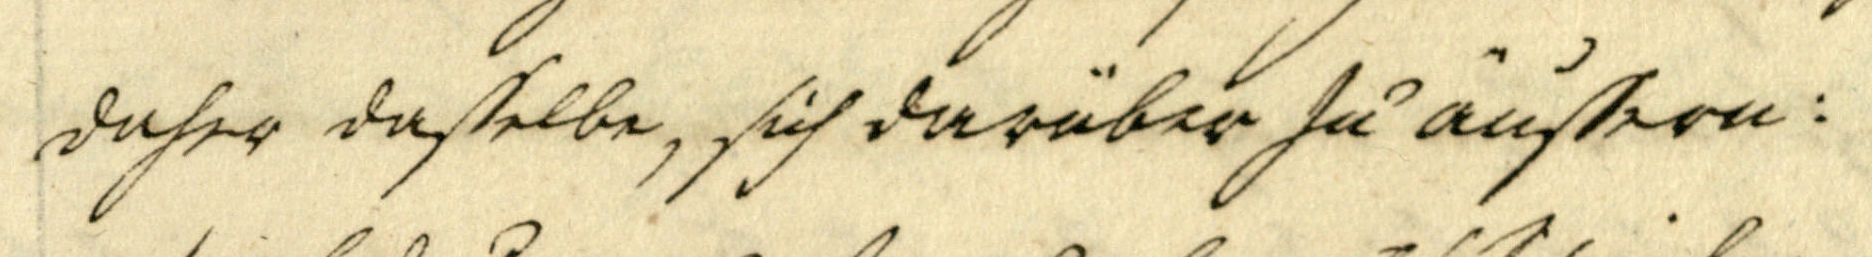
daher dasselbe, sich darüber zu äussern:
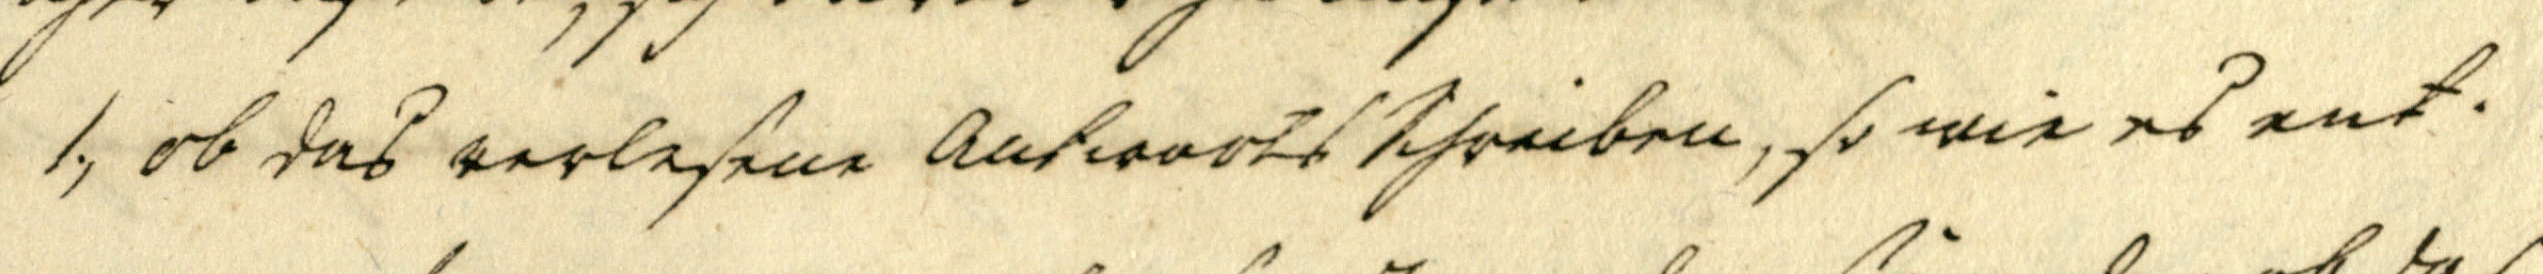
1, ob das verlesene Antworts Schreiben, so wie es ent¬
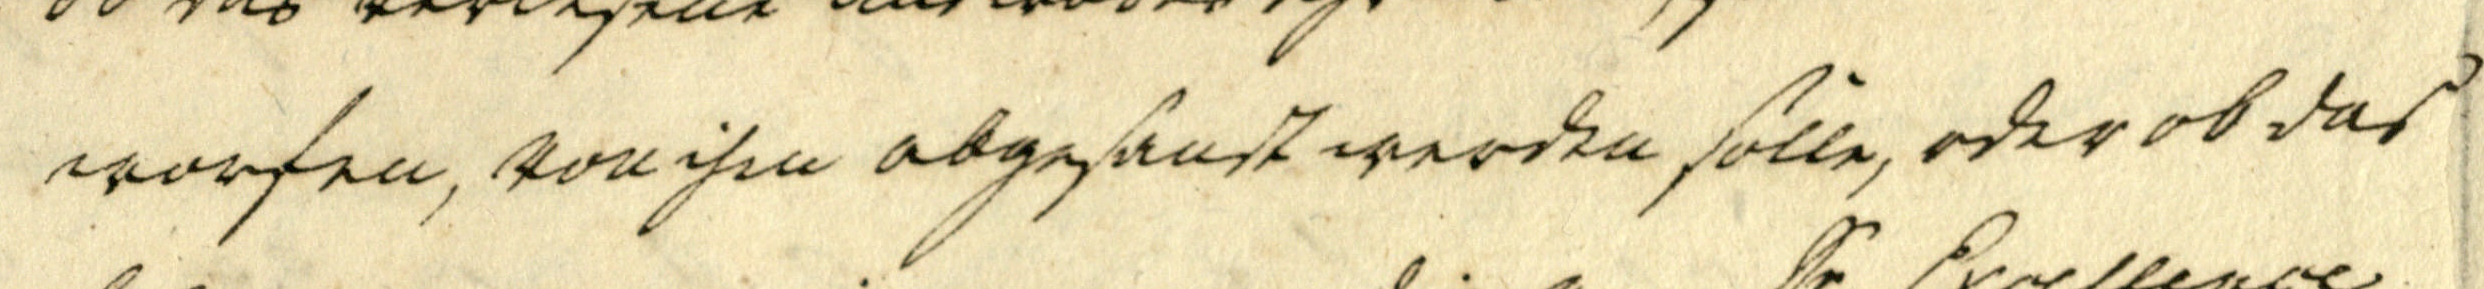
worfen, von ihm abgesandt werden solle, oder ob das
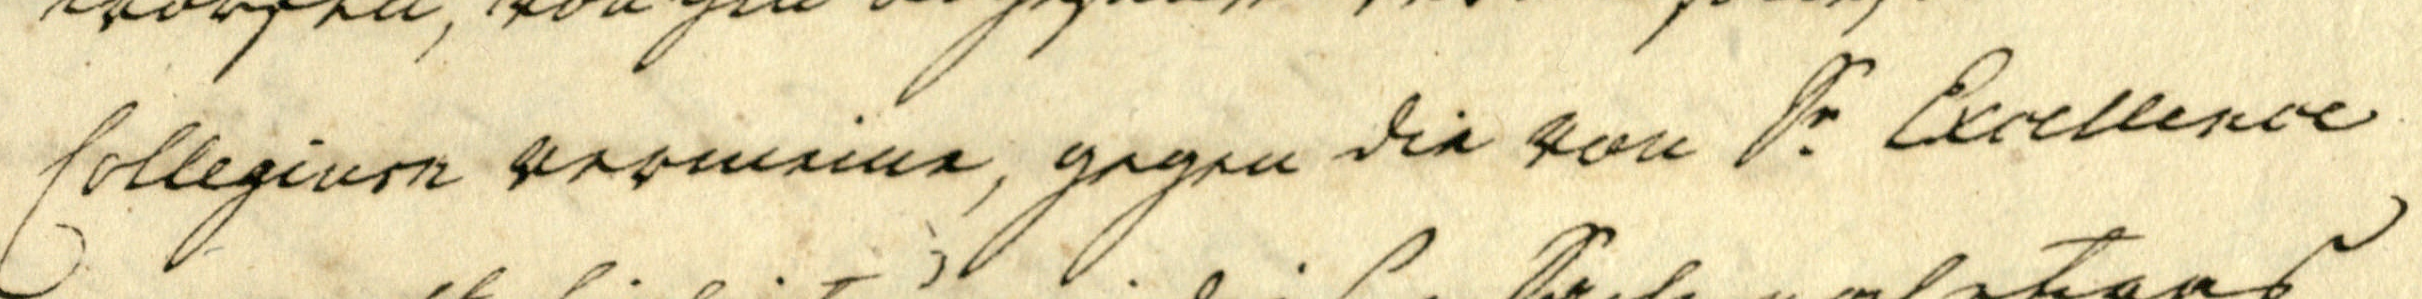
Collegium vermeine, gegen die von Sr Excellence
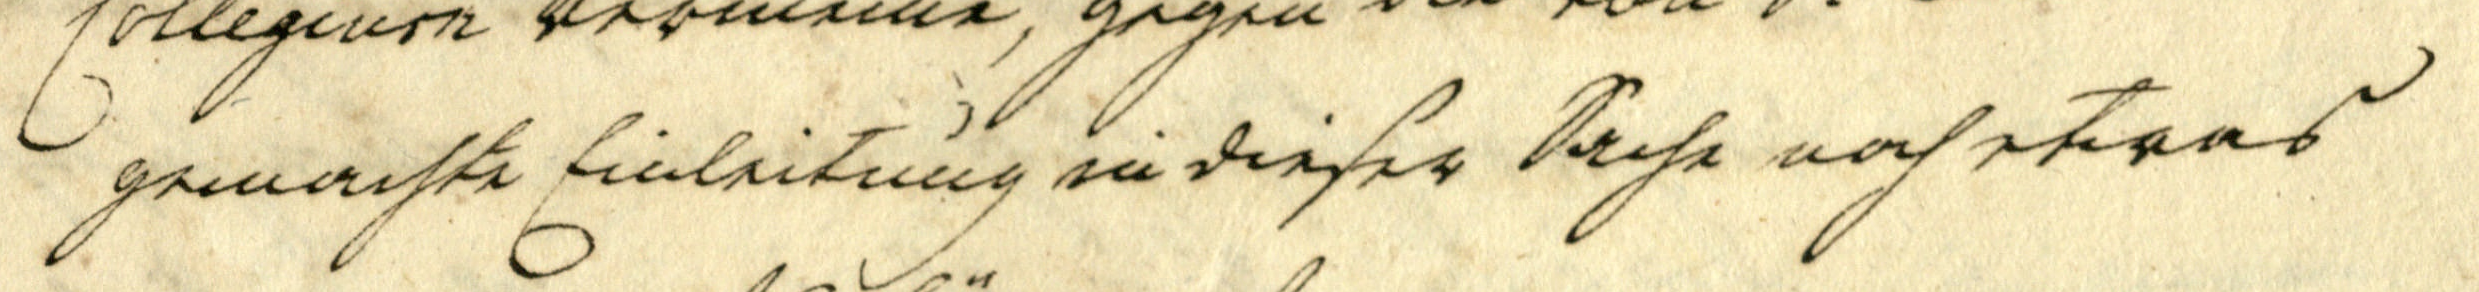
gemachte Einleitung in dieser Sache noch etwas
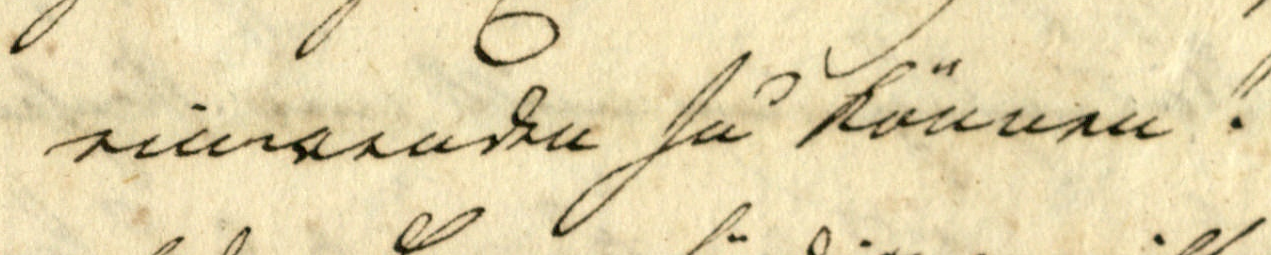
einwenden zu können?
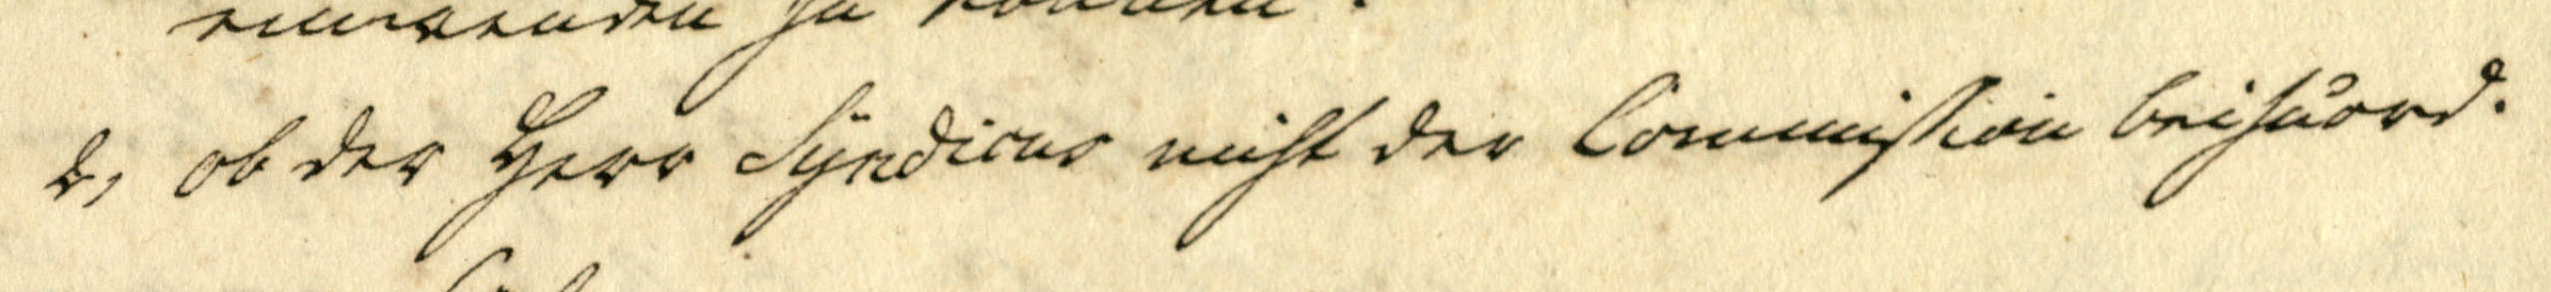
2, ob der Herr Sÿndicus nicht der Commission beizuord¬
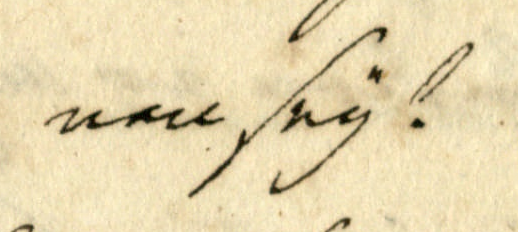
nen seÿ?
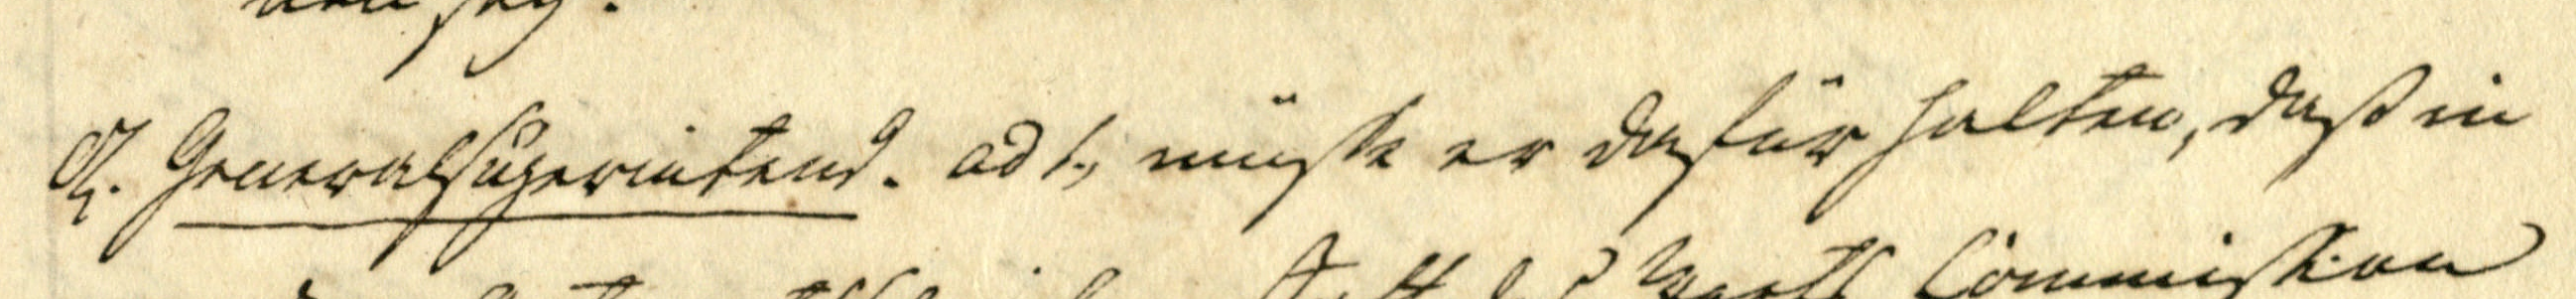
dh. Generalsuperintend. ad 1., müsse er dafür halten, daß in
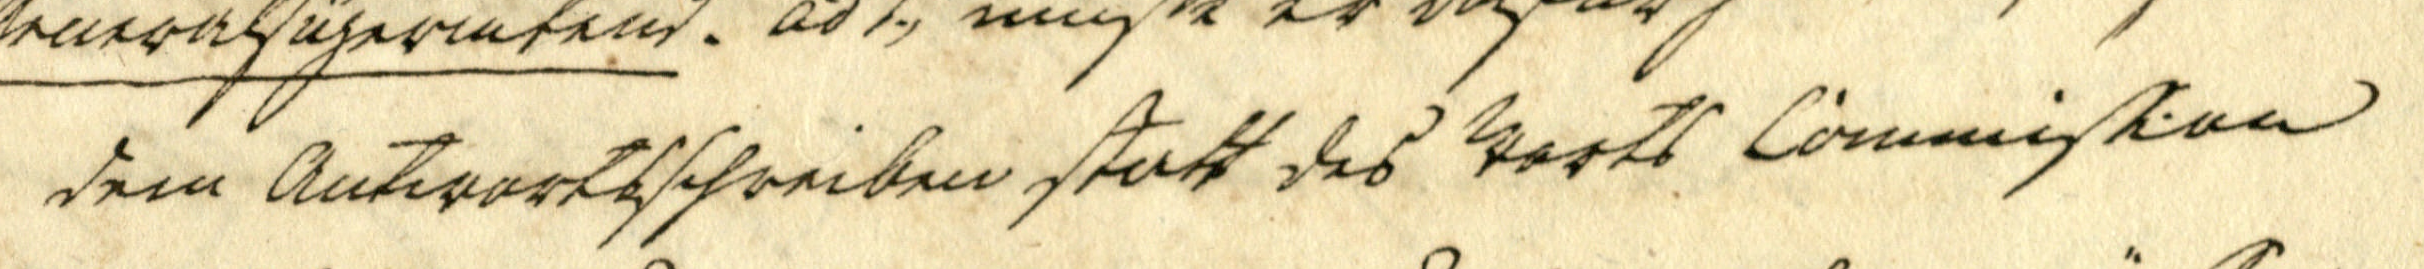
dem Antwortsschreiben statt des Worts Commission
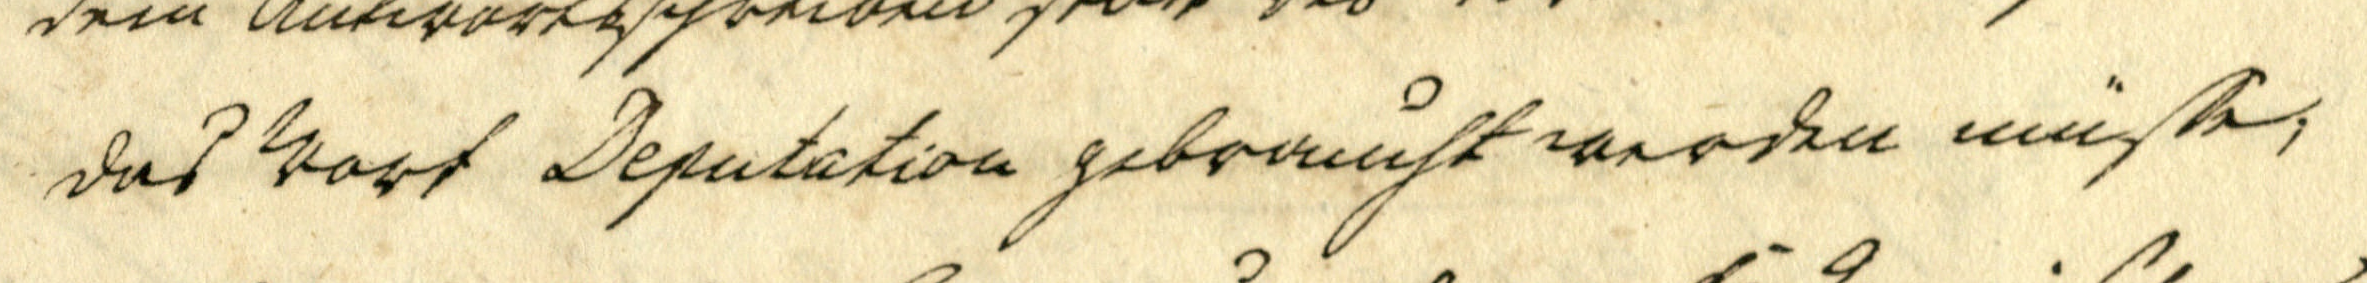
das Wort Deputation gebraucht werden müsse,
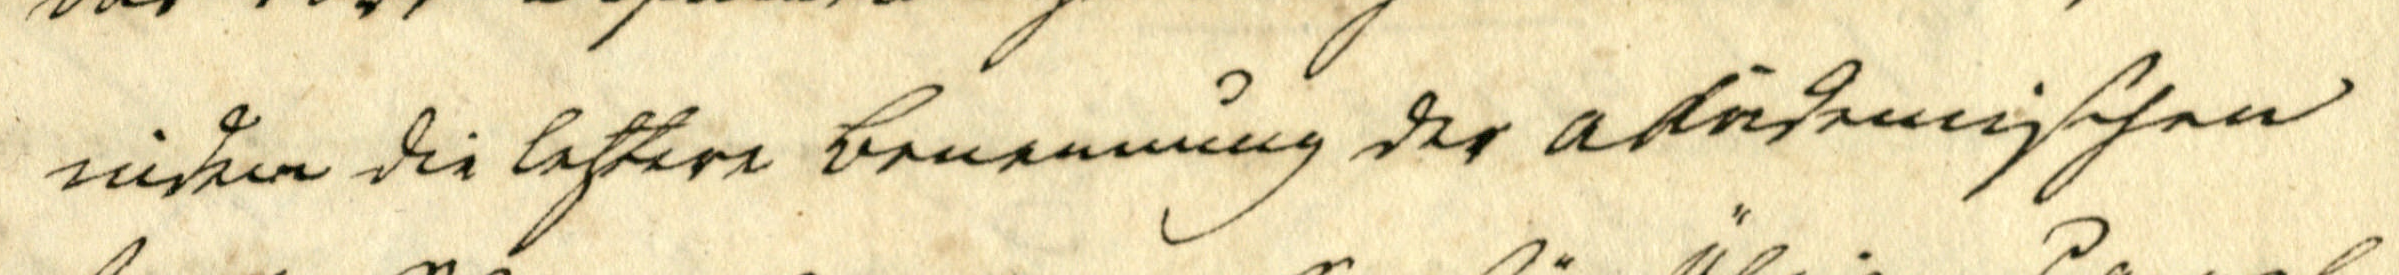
indem die letztere Benennung der akademischen
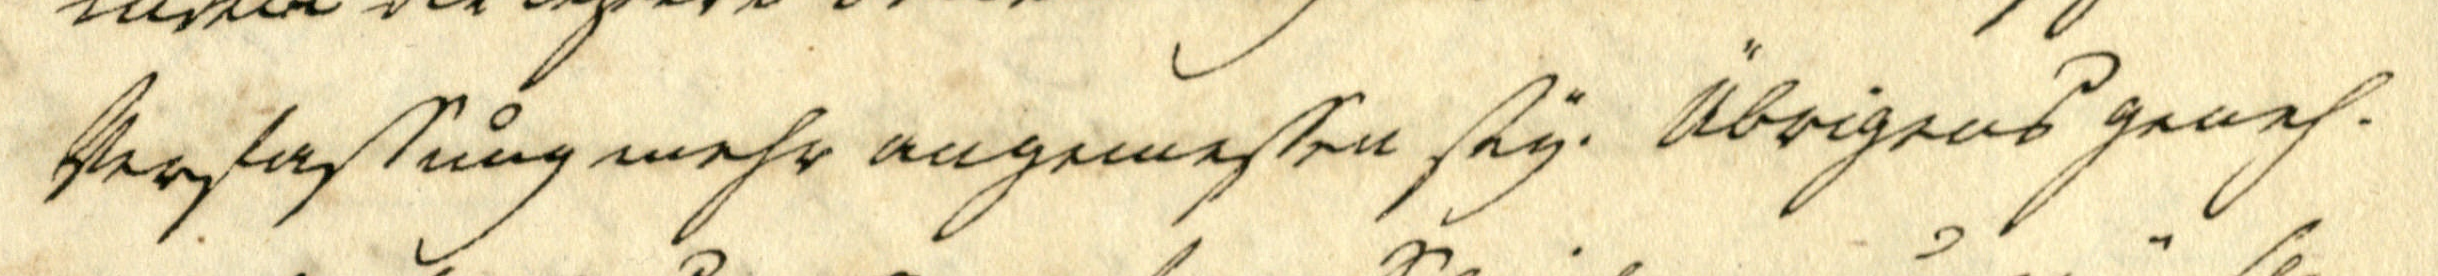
Verfassung mehr angemessen seÿ. Übrigens geneh¬
